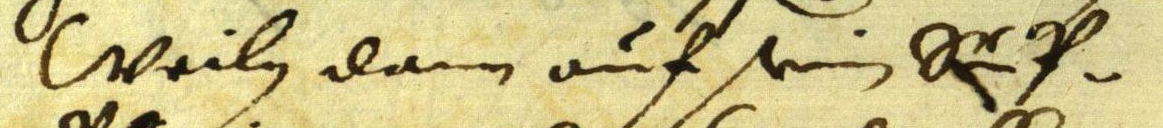Weiln dann aūf sein SūP¬
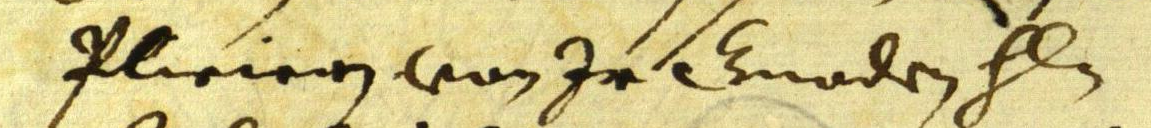Plicieren von Ir Gnaden hln
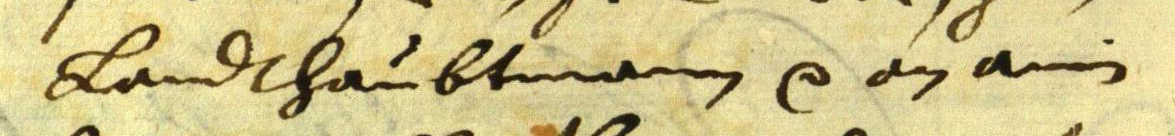Landthaūbtmann etc an ain
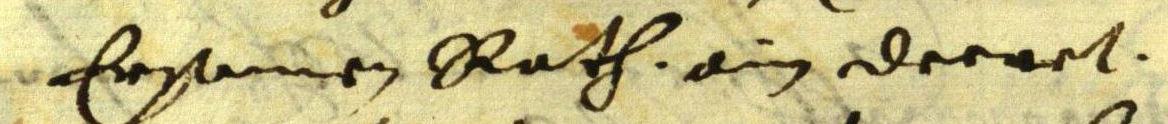Ersamen Rath. ain decret.
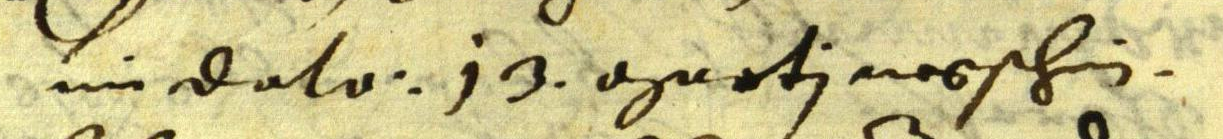in dato: 13. Martj negsthin.
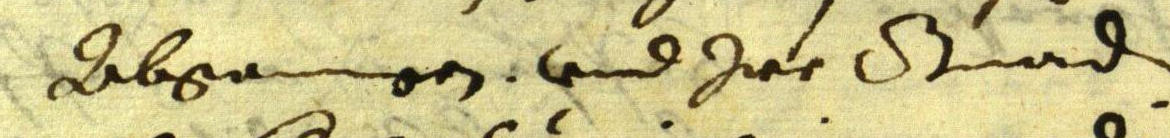Abganngen. vnd Ire Gnad
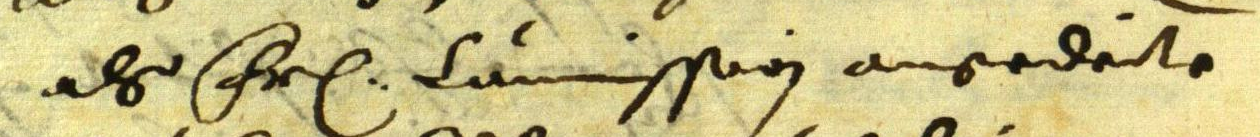als Frl: Commission angedeite
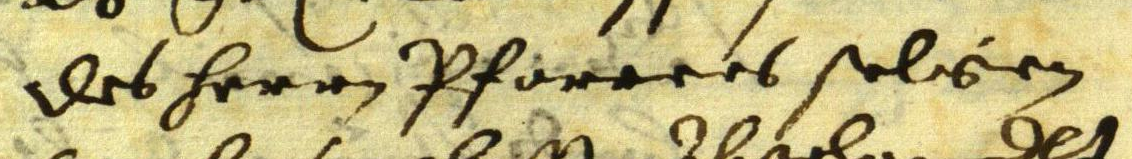des herrn Pfarrers seligen
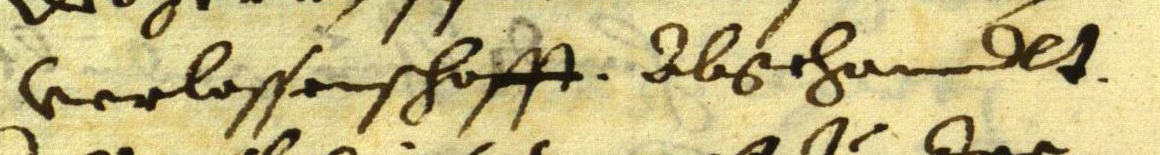verlassenschafft. Abgehanndlt.
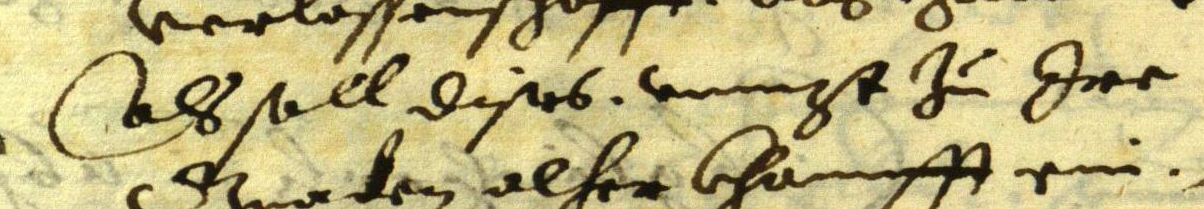Als soll dises. vnnzt Zū Ire
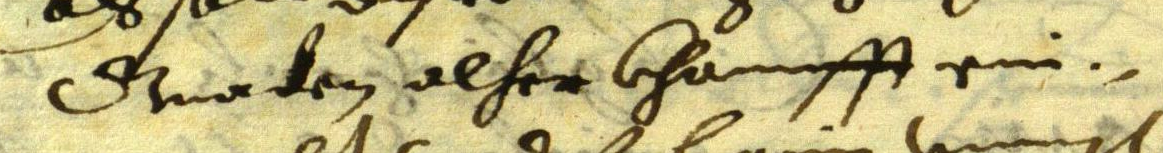Gnaden alher khonnfft ein¬
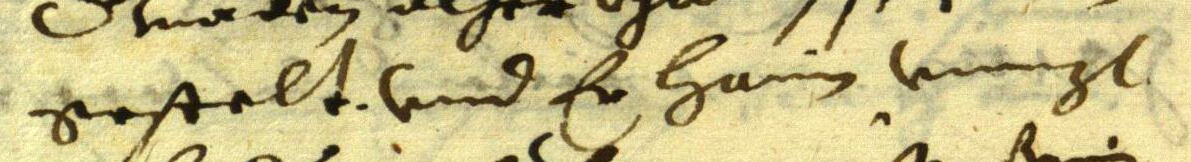gestelt. vnd Er Haim vnnzt
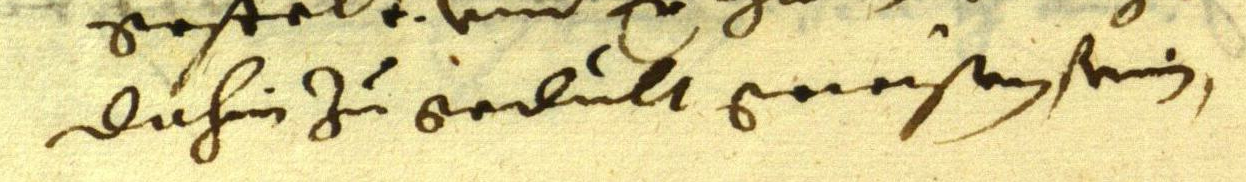dahin Zū gedūlt gewisen sein.
